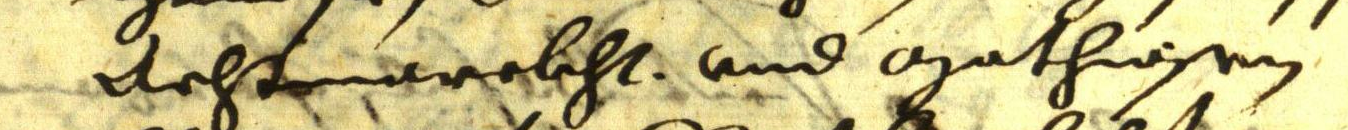Achtmarckht. vnd Mathiasen
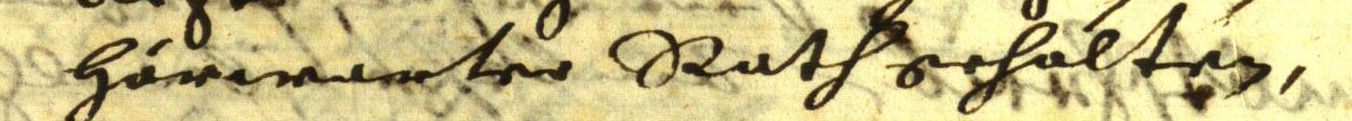Hōrwarter Rath gehalten,
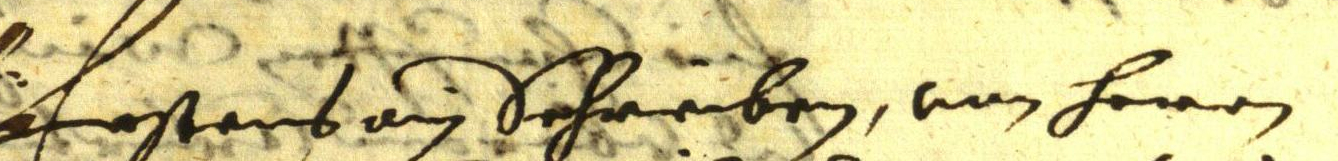Erstens ain Schreiben, von herrn
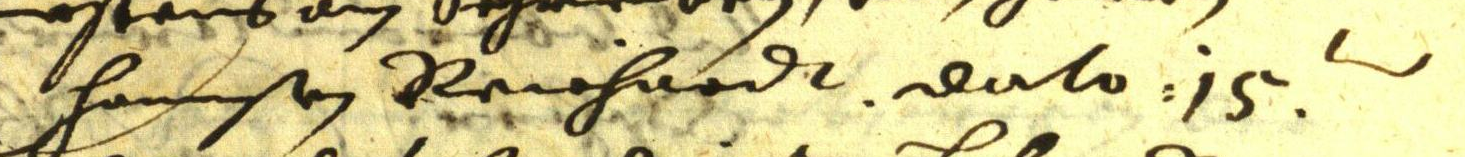hannsen Reichardt. dato: 15.t
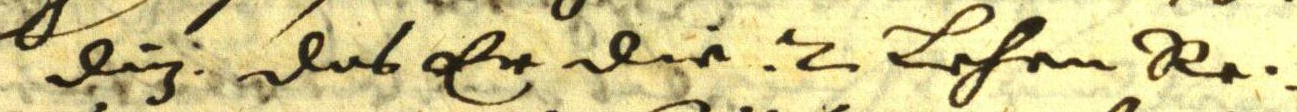diz. das Er die .2. Lehen Re¬
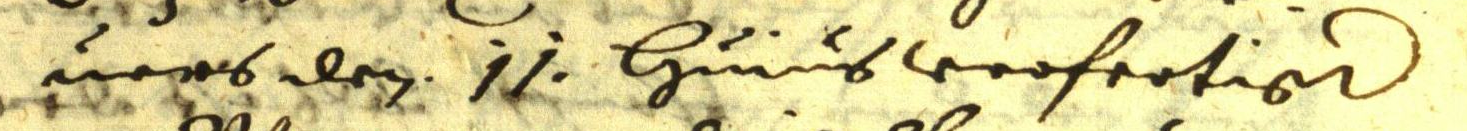ūers den .11. Hūiūs verfertigt
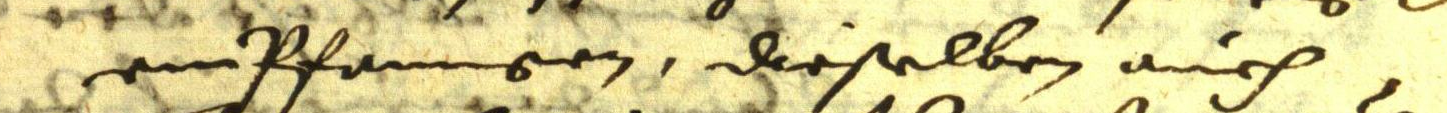emPfanngen, dieselben aūch
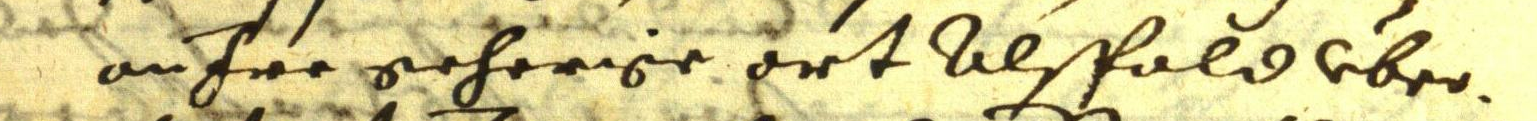an Ire geherige ort Alspald v̄ber¬
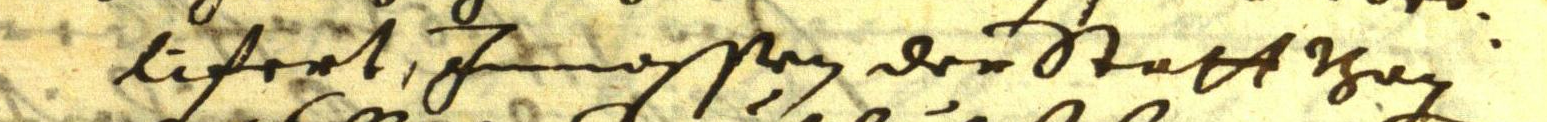lifert, Inmassen der Statt Boz
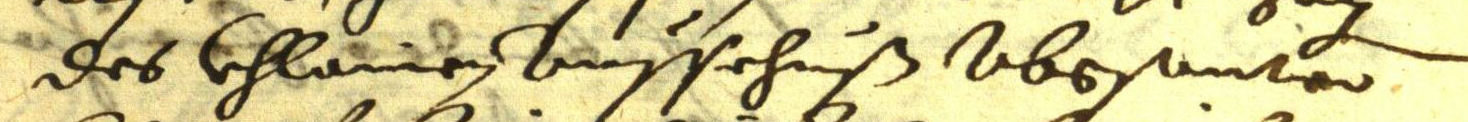des khlainen Aūsschūß Abgsanter
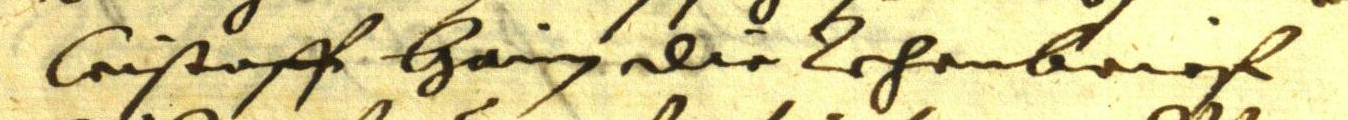Cristoff Haim die Lehenbrief
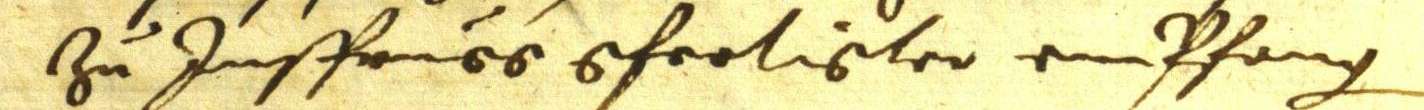Zū Insprūgg gfertigter emPfang
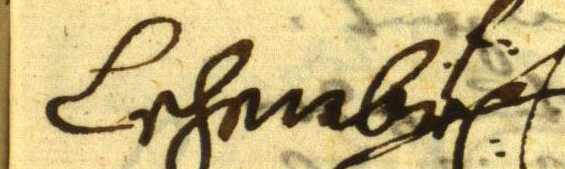Lehenbr:
